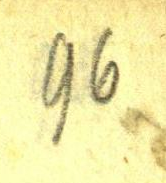96
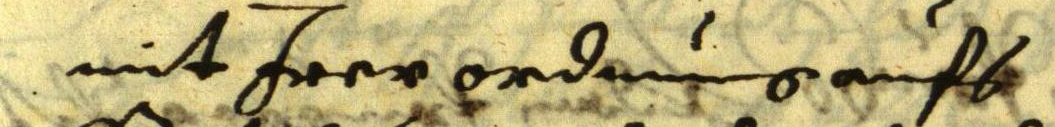mit Irer ordnūng aūfs
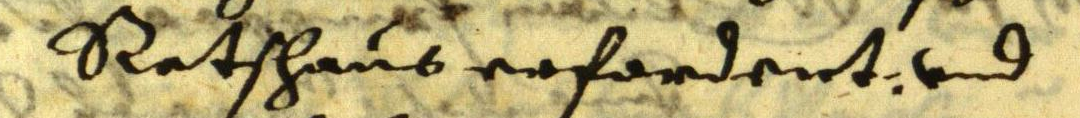Ratshaūs erfordert: vnd
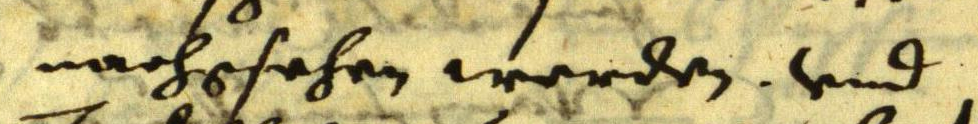nachgsehen werden. vnd
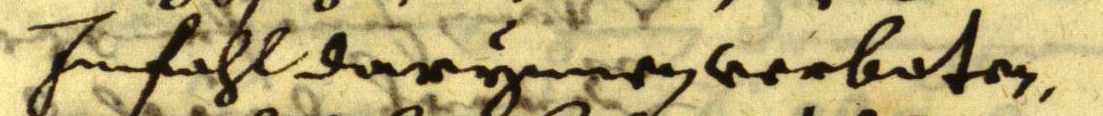Imfahl darȳnnen verboten
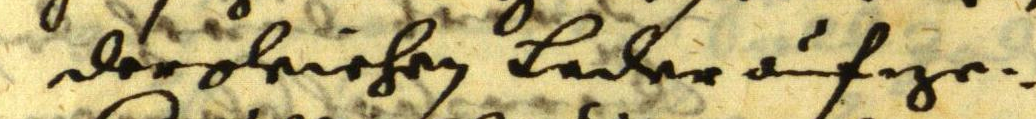dergleichen Leder aūfze¬
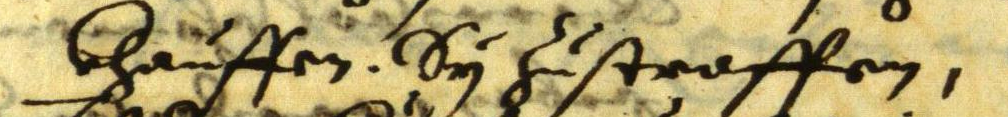khaūffen. Sȳ Zū straffen,
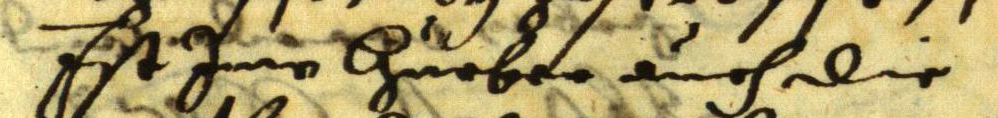Ist Ime Hūeber aūch die
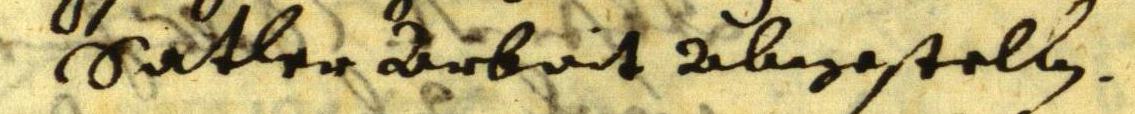Satler Arbait Abzestelln.
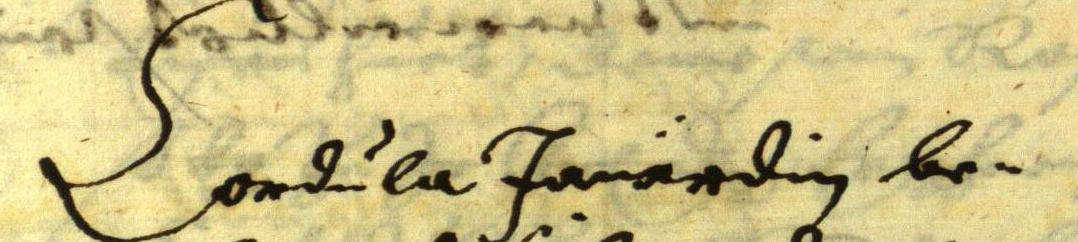Cordūla Janärdin be¬
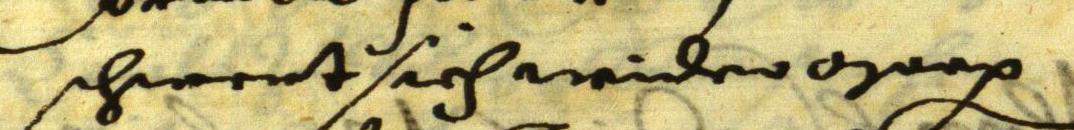schwert sich wider Marx
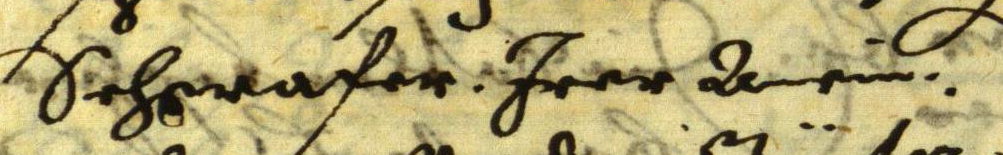Schgrafer. Irer Anein¬
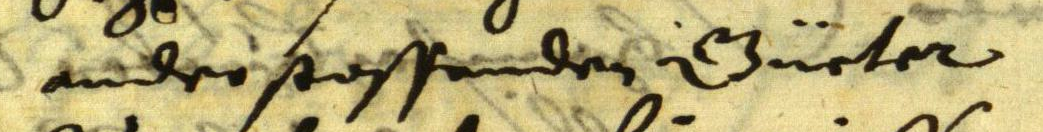ander stossende Güeter
